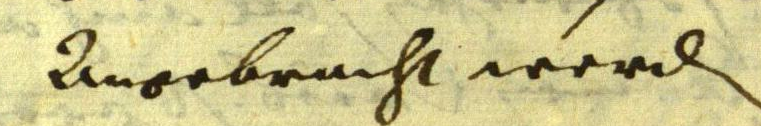Angebracht werd
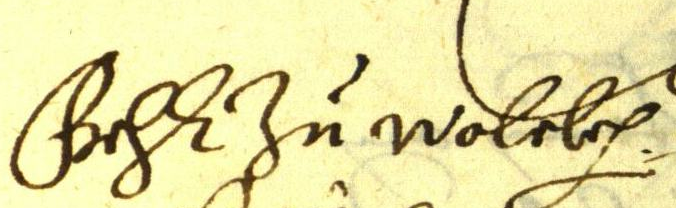Frh Zū Wolckh¬
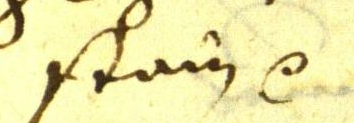stain etc.
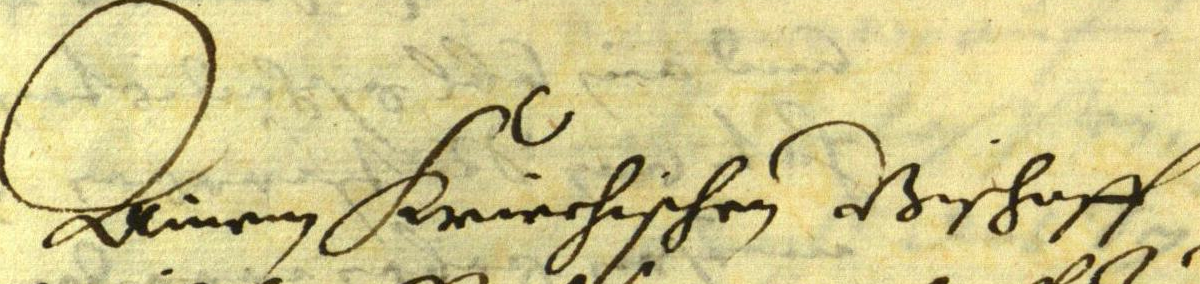Ainem Kriechischen Bischoff
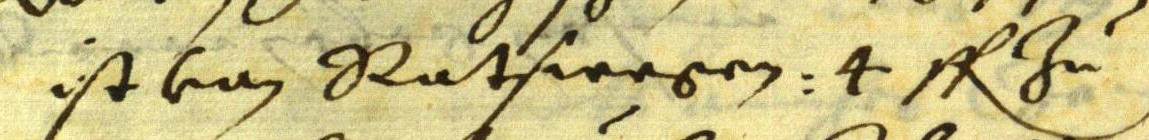ist von Ratswegen: 4 fl Zū
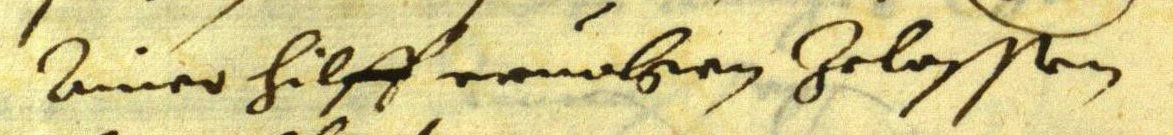Ainer hilff ervōlgen Zelassen
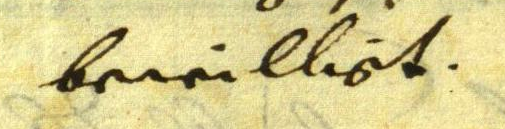bewilligt.
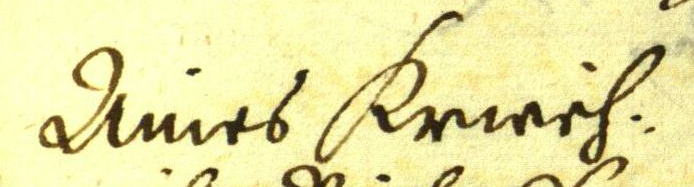Aines Kriech¬
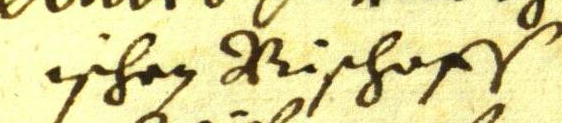ischen Bischoff
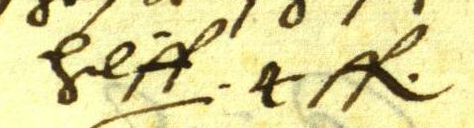Hilff —. 4 fl.
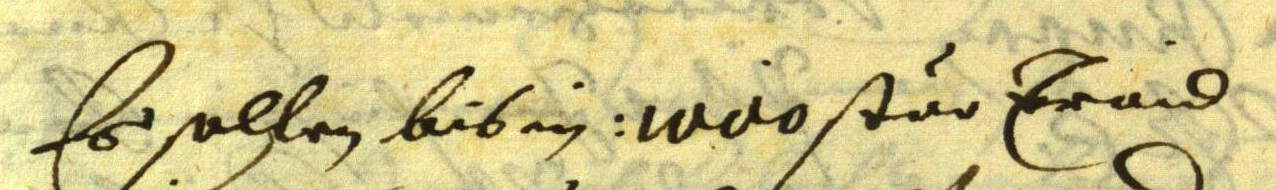Es sollen bis in: 1000 Stār Traid
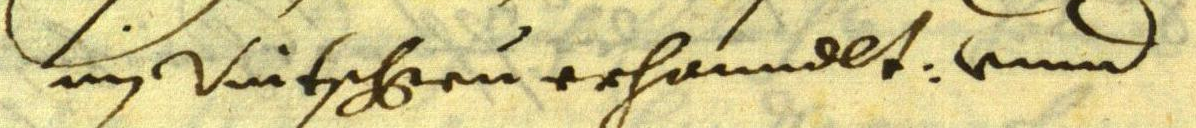im Vintschgeū erhanndlt: vnnd
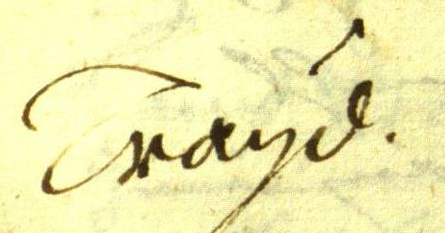Traȳd.
